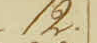12.
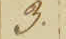3.
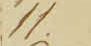11.
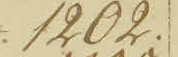1202.
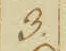3.
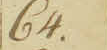64.
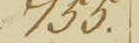755.
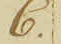6.
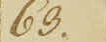63.
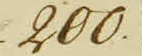200.
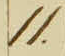11.
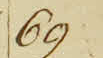69
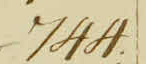744.
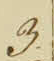3.
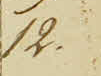12.
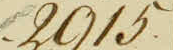2915.
